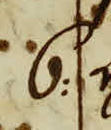6:
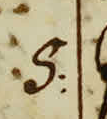5:
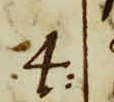4:
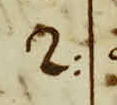2:
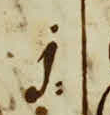1:
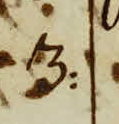3:
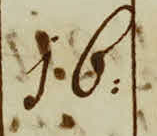16:
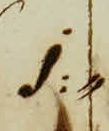1:
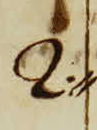2
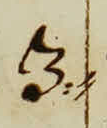3:
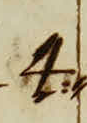4:
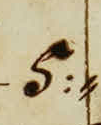5:
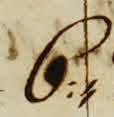6:
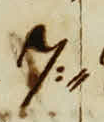7:
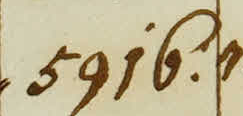5916.
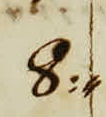8:
